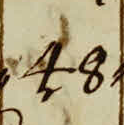48
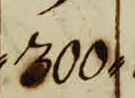300
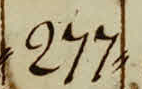277
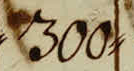300
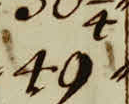49
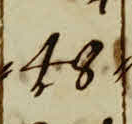48
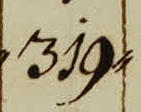319
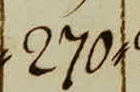270
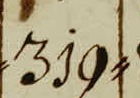319
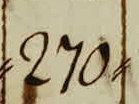270
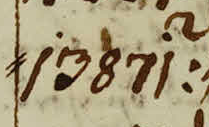13871
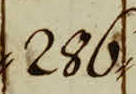286
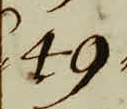49
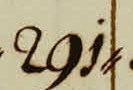291
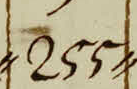255
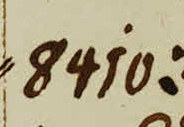8410
